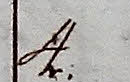4.
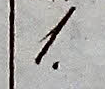1.
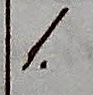1.
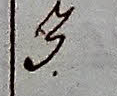3.
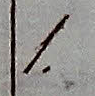1.
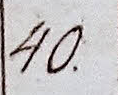40.
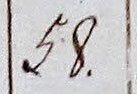58.
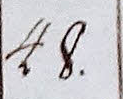48.
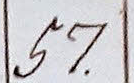57.
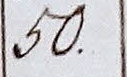50.
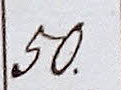50.
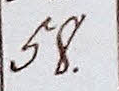58.
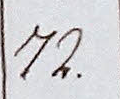72.
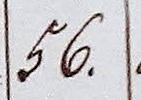56.
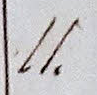11.
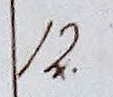12.
